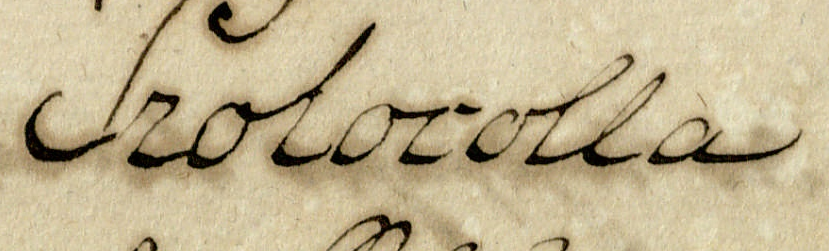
Protocolla
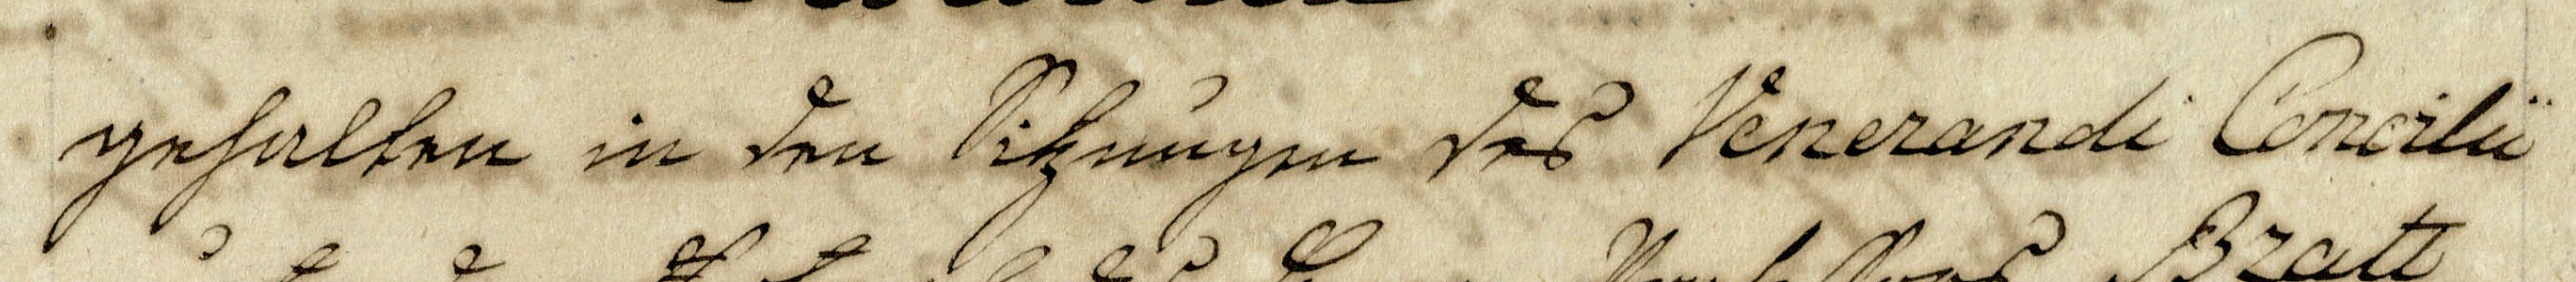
gehalten in den Sitzungen des Venerandi Concilii
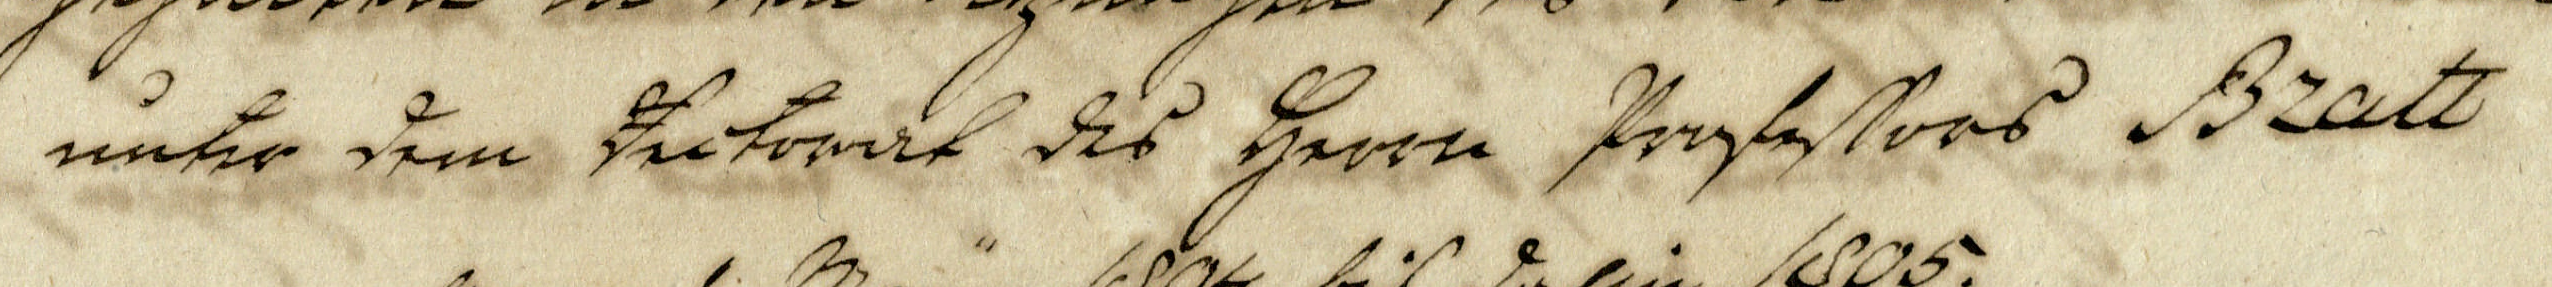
unter dem Rectorat des Herrn Professors Bratt
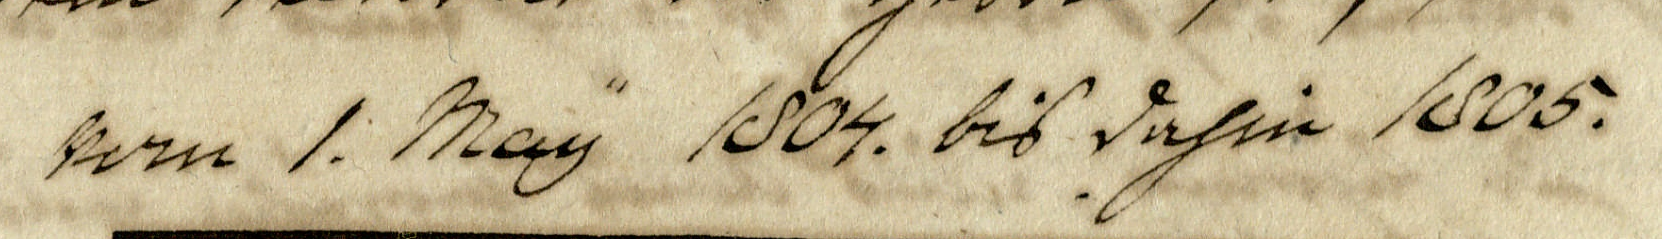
vom 1. Maÿ 1804. bis dahin 1805.
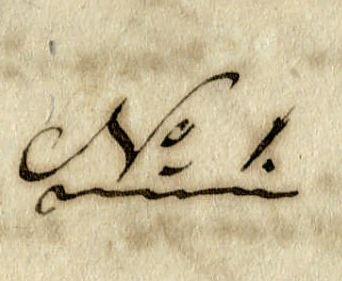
No 1.
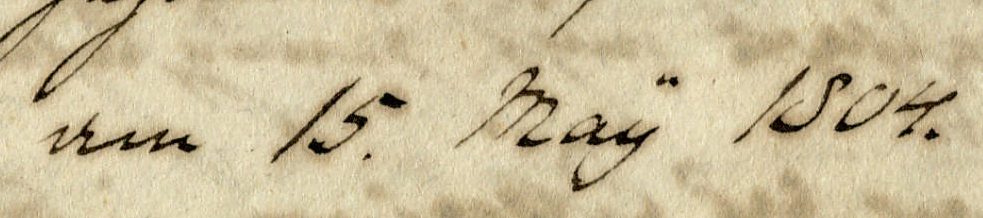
am 15. Maÿ 1804.
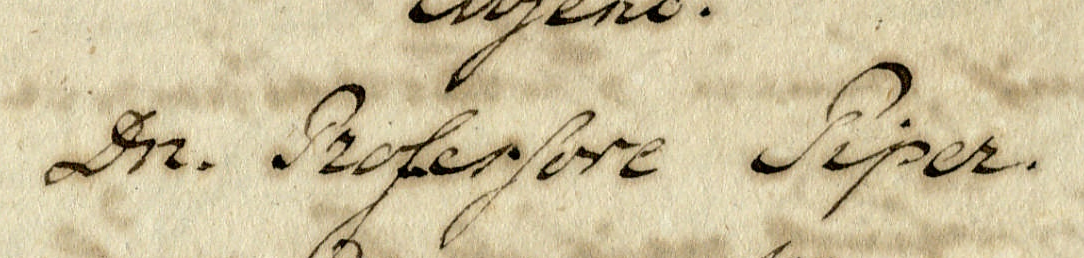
Dn. Professore Piper.
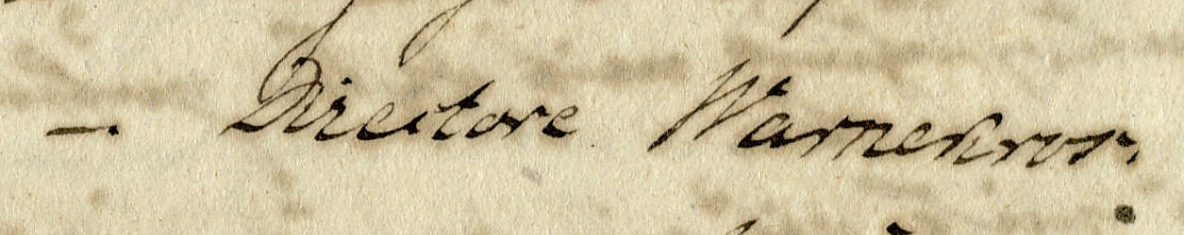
Directore Warnekros.
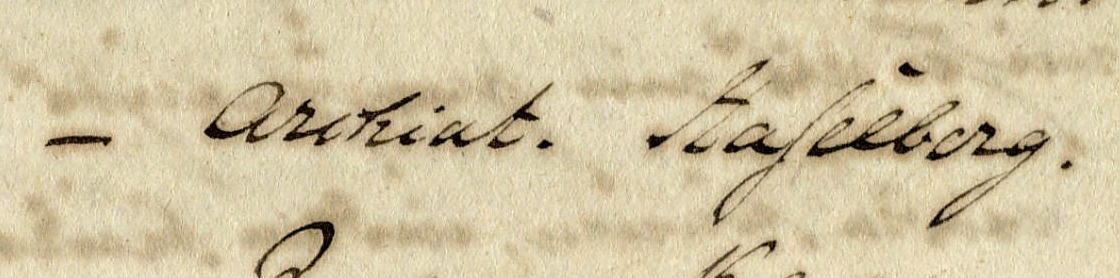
Archiat. Haselberg.
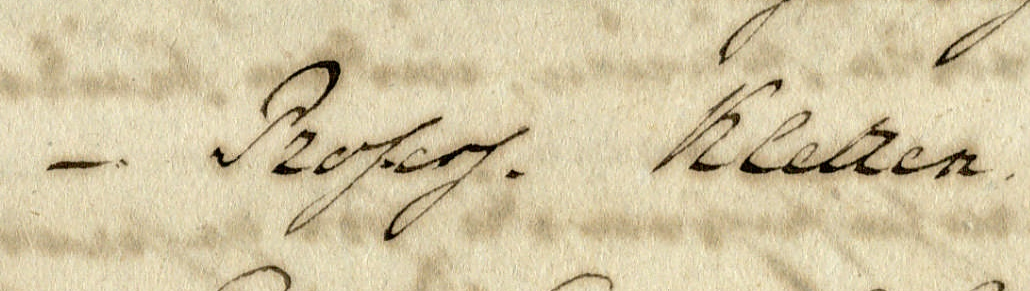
Profess. Kletten
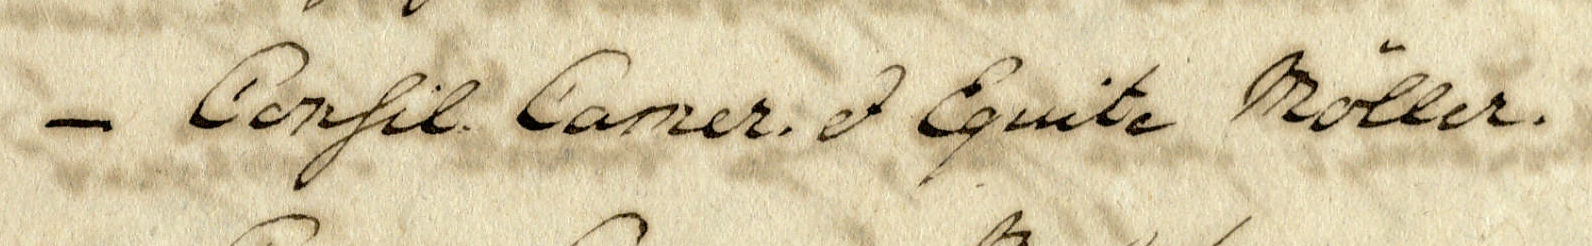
Consil. Camer. et Equite Möller.
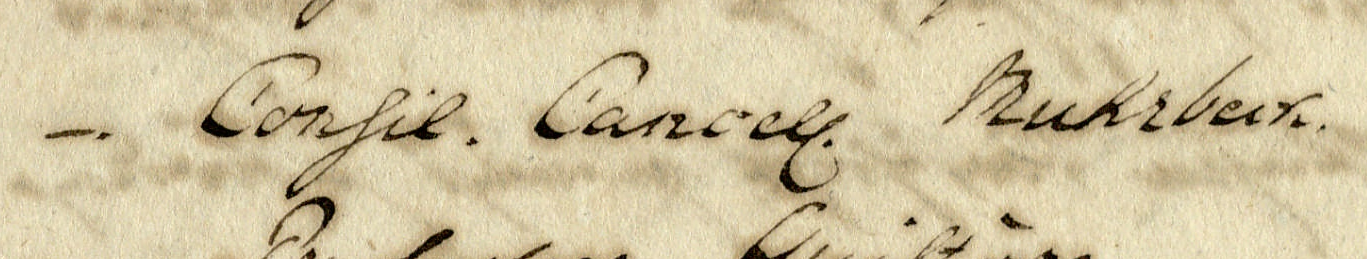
Consil. Cancell. Muhrbeck.
